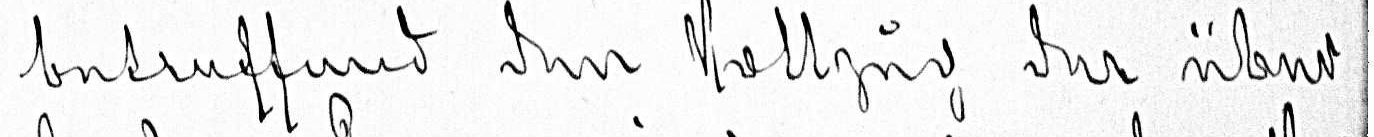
betreffend den Vollzug der über
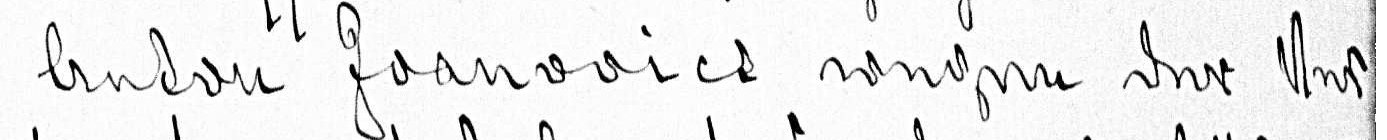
Anton [Antal] Joanovics wegen des Ver¬
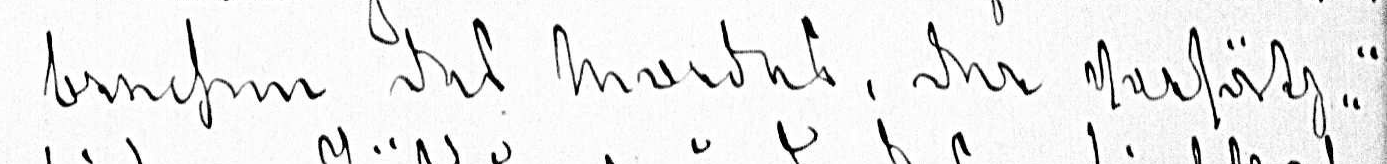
brechens des Mordes, der vorsätz¬
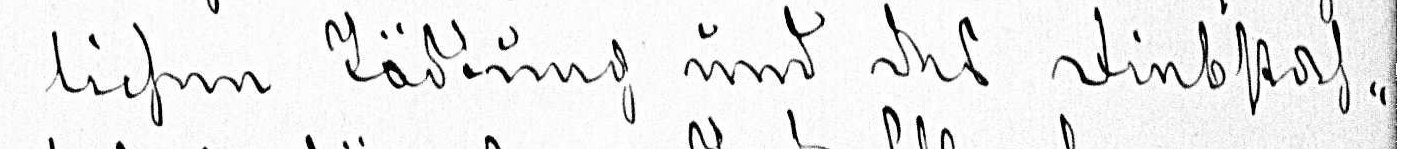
lichen Tödtung und des Diebstah¬
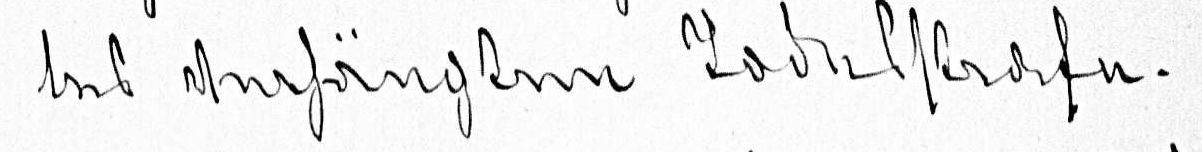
les verhängten Todesstrafe.
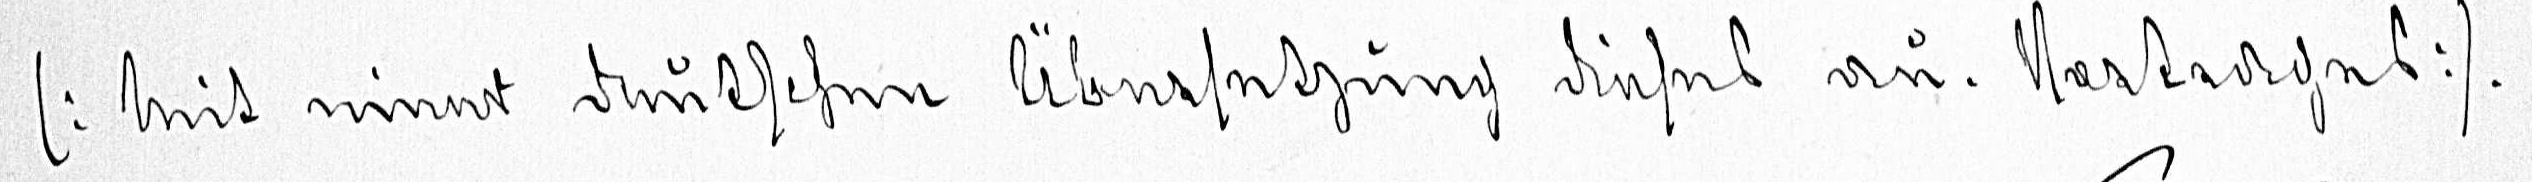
(Mit einer deutschen Übersetzung dieses au. Vortrages)
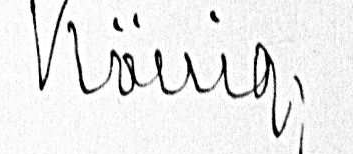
König
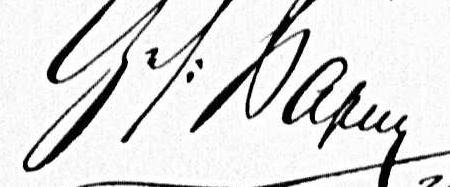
Ges Papay
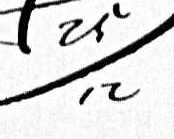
25/12
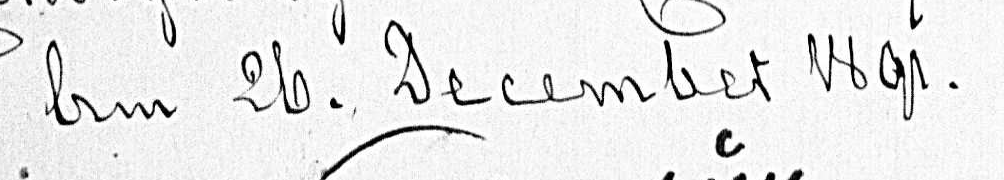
Am. 26. December 1891
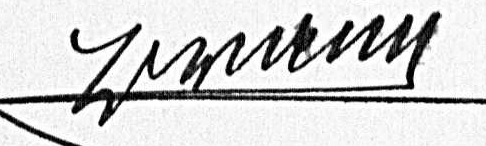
Braun
